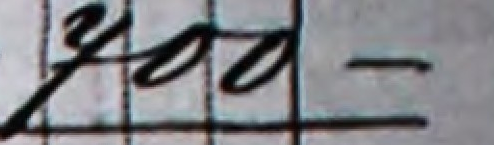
700 -
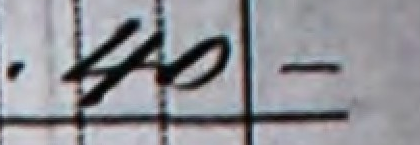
40 -
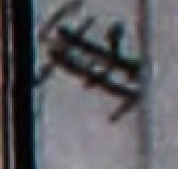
???
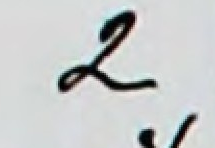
2
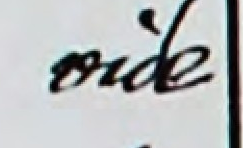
vide
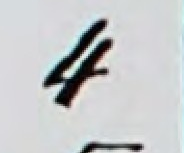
4
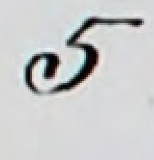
5
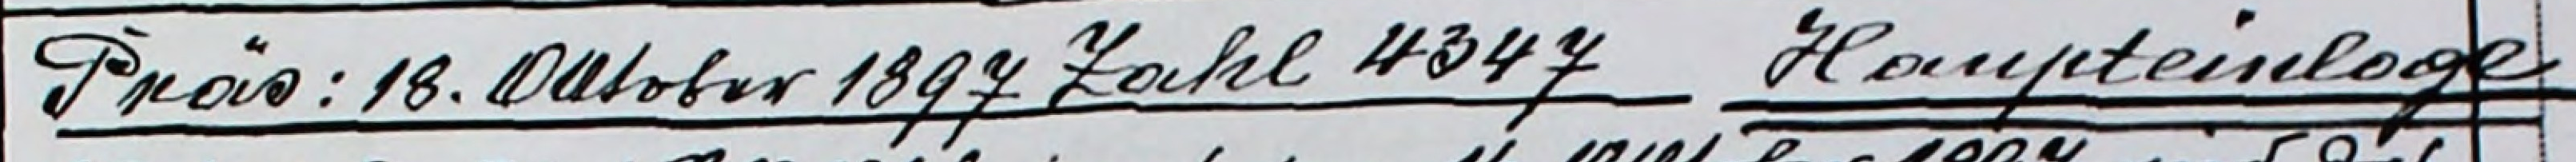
Präs: 18. Oktober 1897 Zahl 4347
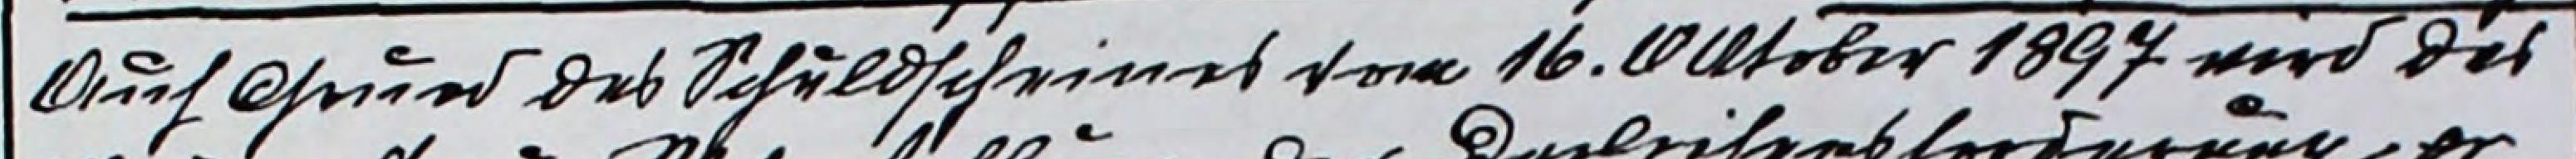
Haupteinlage
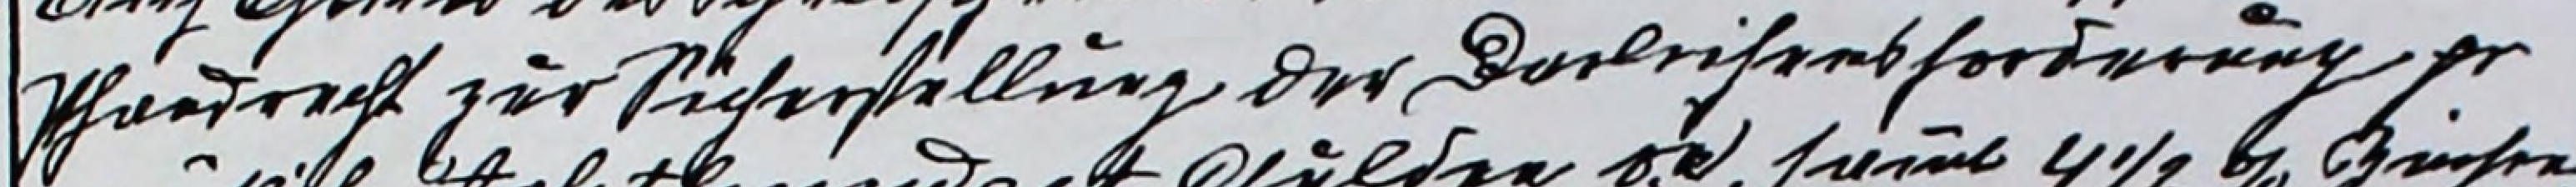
Auf Grund des Schuldscheines vom 16. Oktober 1897 wird das
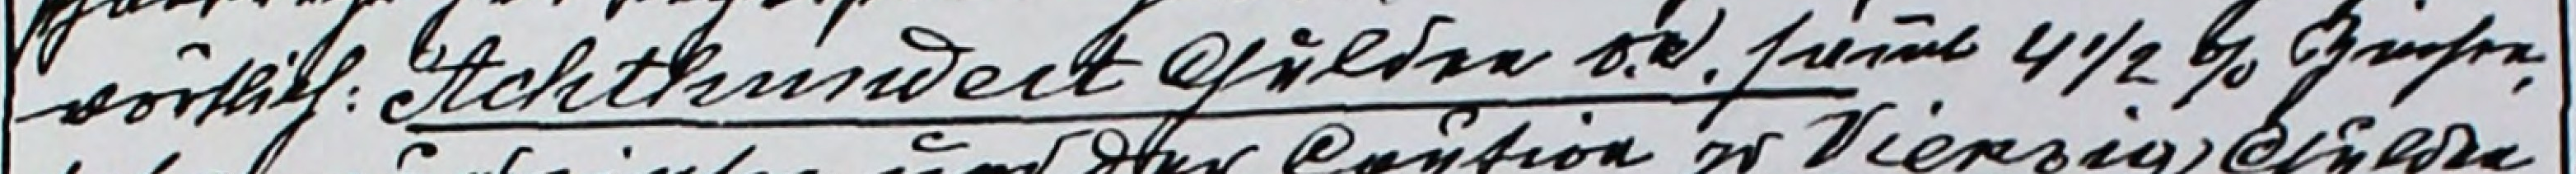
Pfandrecht zur Sicherstellung der Darleihensforderung pr
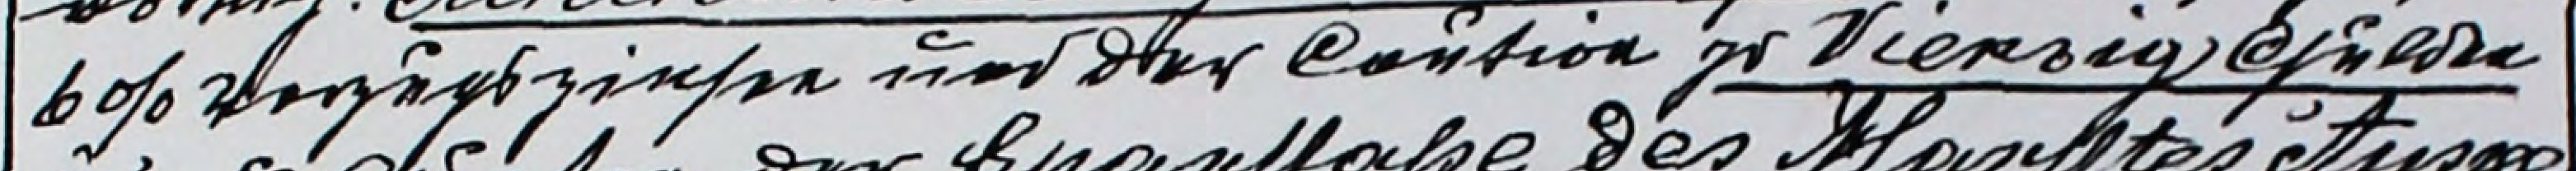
wörtlich: Achthundert Gulden ö.k. sammt 4 1/2 % Zinsen,
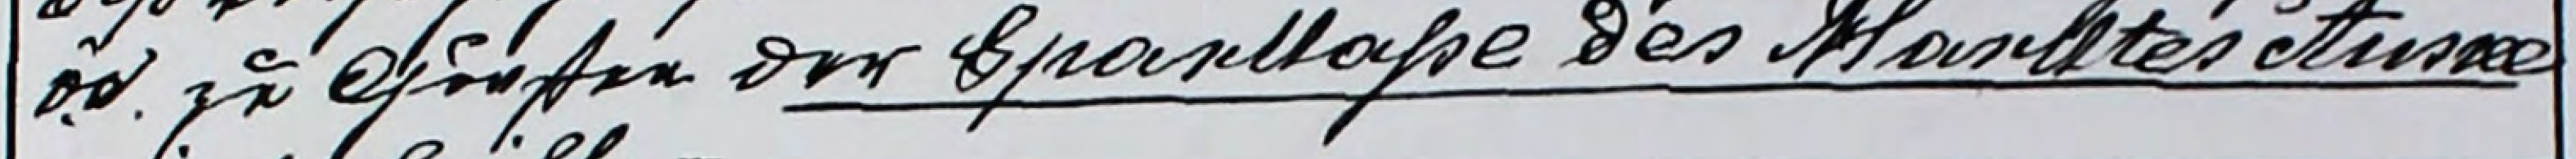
6 % Verzugszinsen und der Caution pr Vierzig Gulden
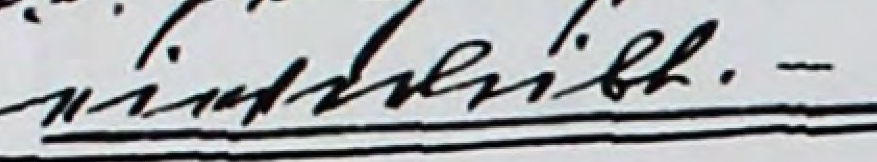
ö.k. zu Gunsten der Sparkasse des Marktes Aussee einverleibt.-
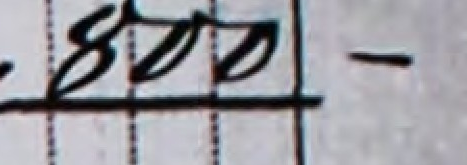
800 -
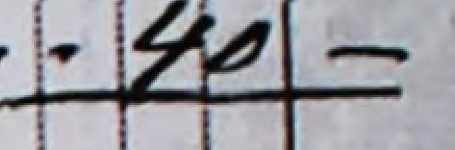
40 -
